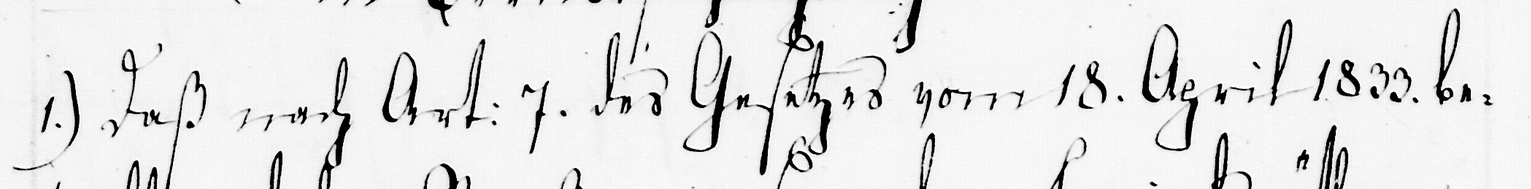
1.) Daß nach Art: 7. des Gesetzes vom 18. April 1833. be¬
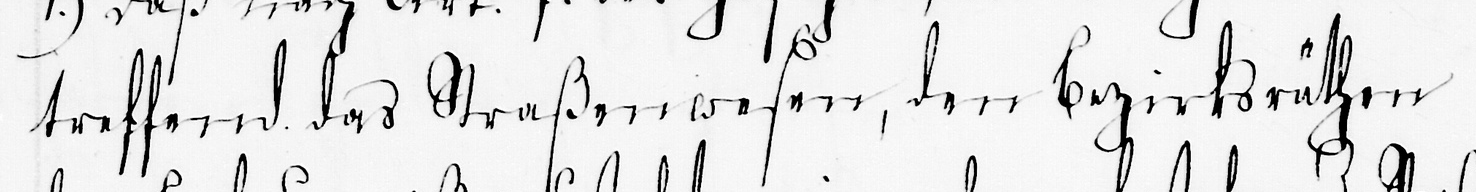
treffend das Straßenwesen, den Bezirksräthen
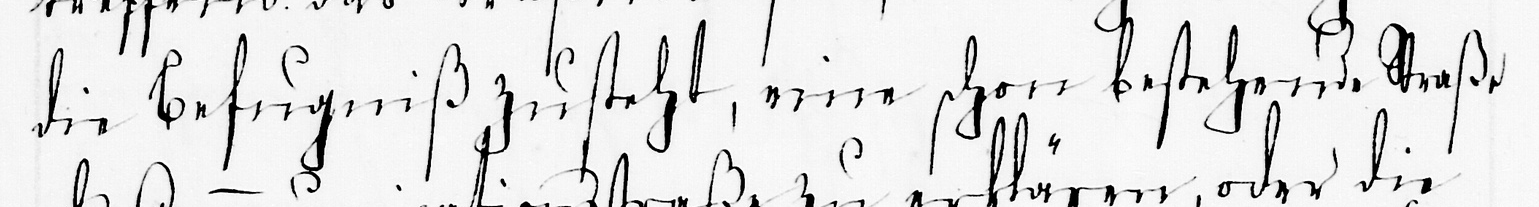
die Befugniß zusteht, eine schon bestehende Straße
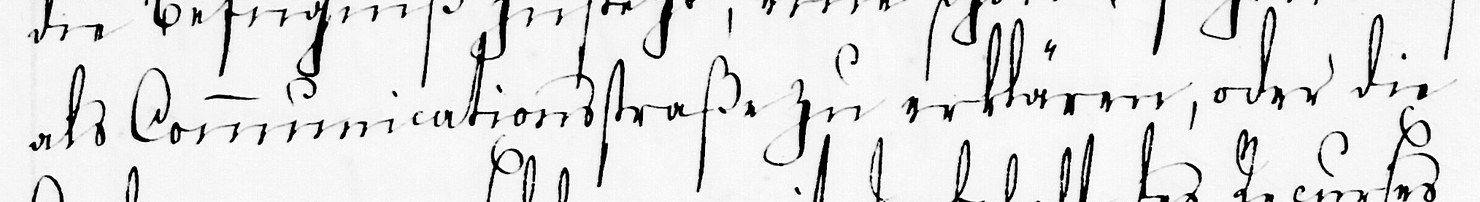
als Communicationsstraße zu erklären, oder die
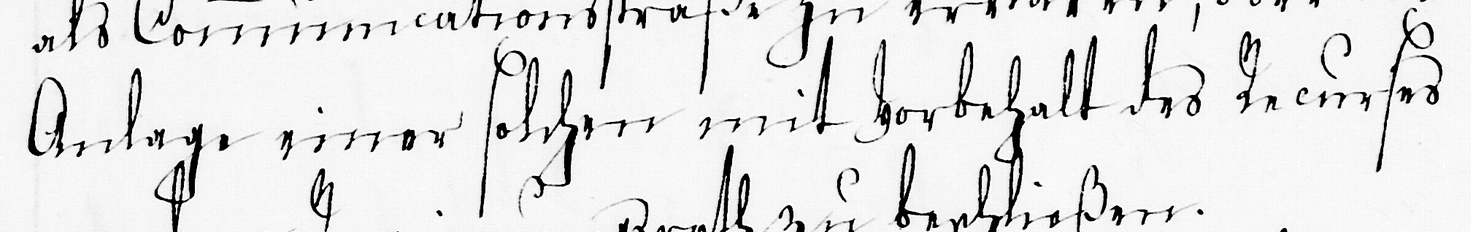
Anlage einer solchen mit Vorbehalt des Recurses
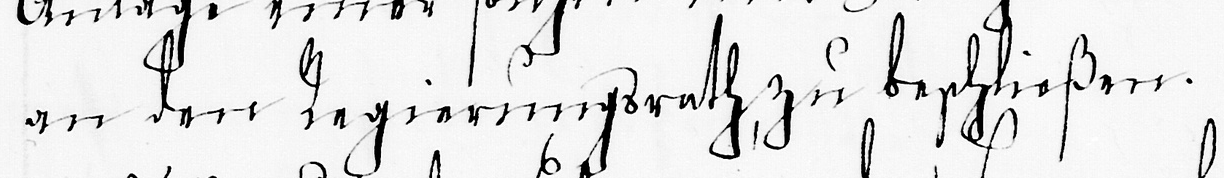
an den Regierungsrath, zu beschliessen.
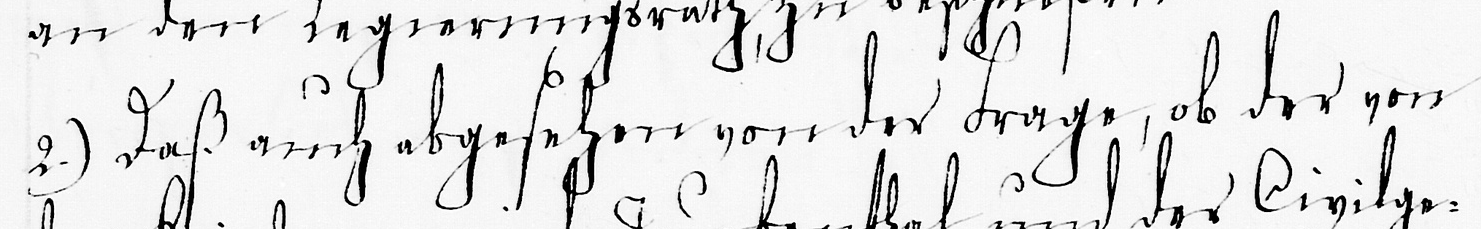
2.) Daß auch abgesehen von der Frage, ob der von
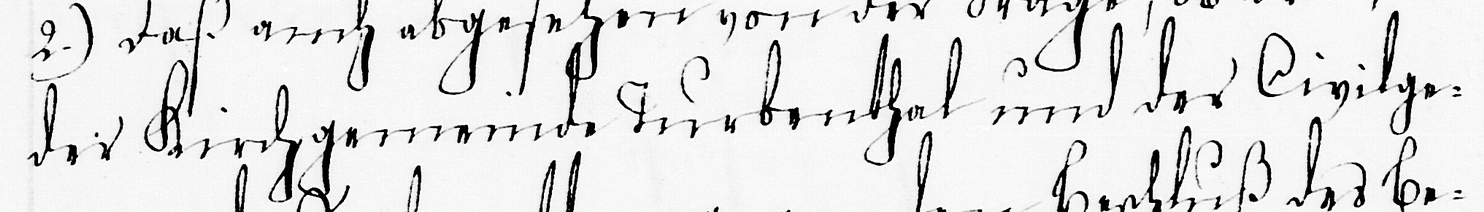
der Kirchgemeinde Turbenthal und der Civilge¬
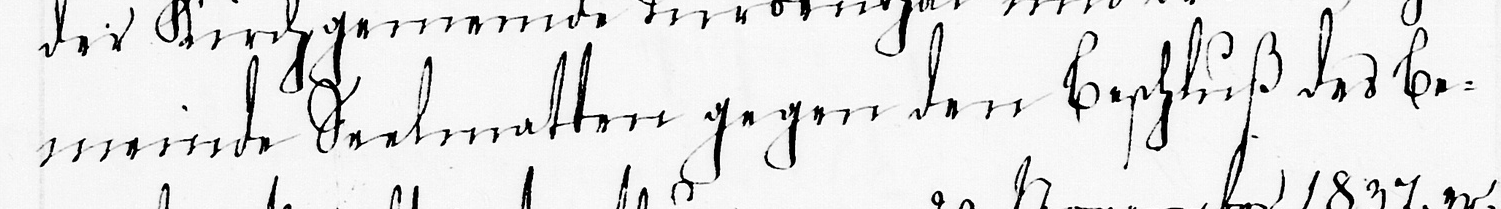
meinde Seelmatten gegen den Beschluß des Be¬
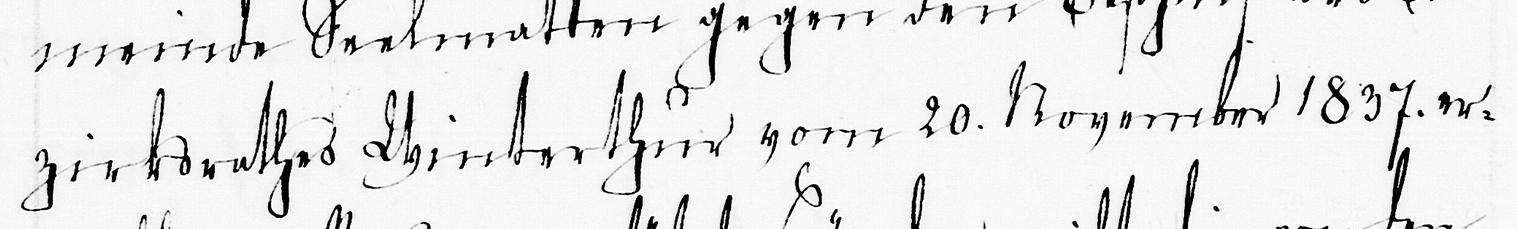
zirksrathes Winterthur vom 20. November 1837. er¬
